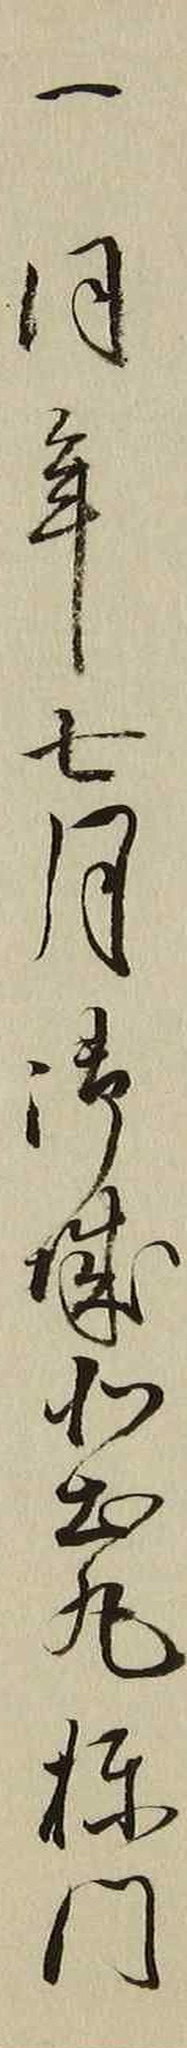一同年七月御城北出丸棟門
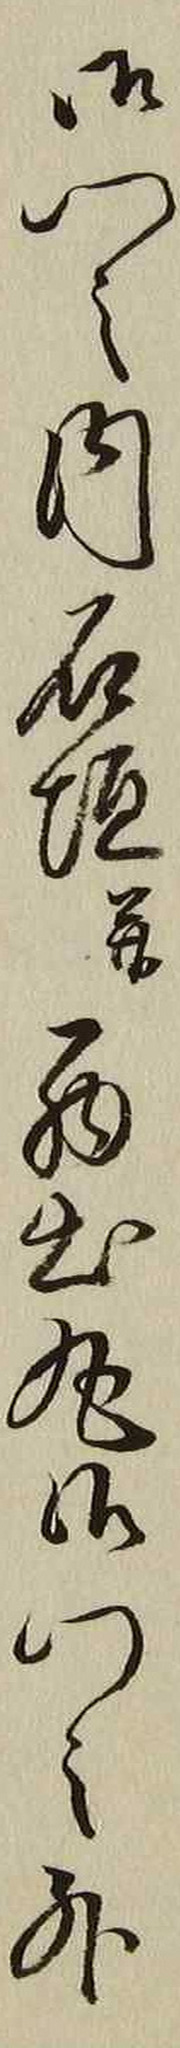御門之内石垣并西出丸御門之外
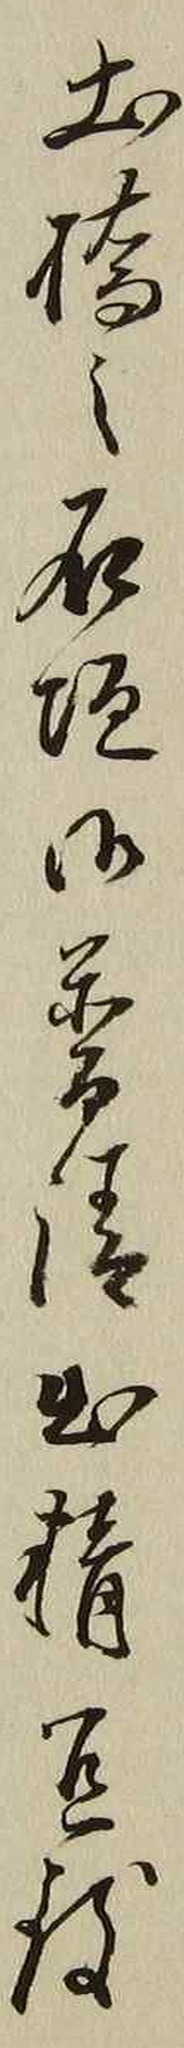土橋之石垣御普請出精宜致
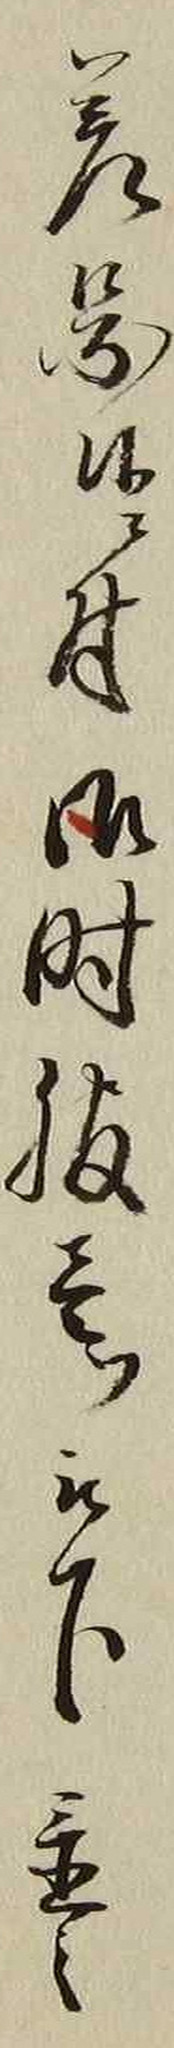差図候ニ付御時服壱ツ被下置之
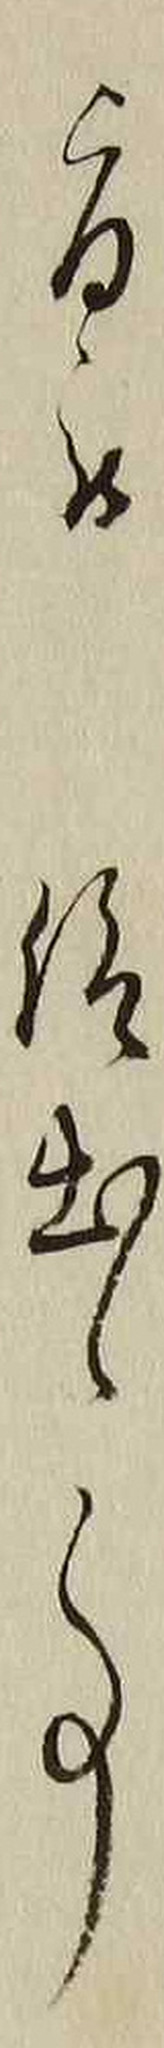旨被仰出候事
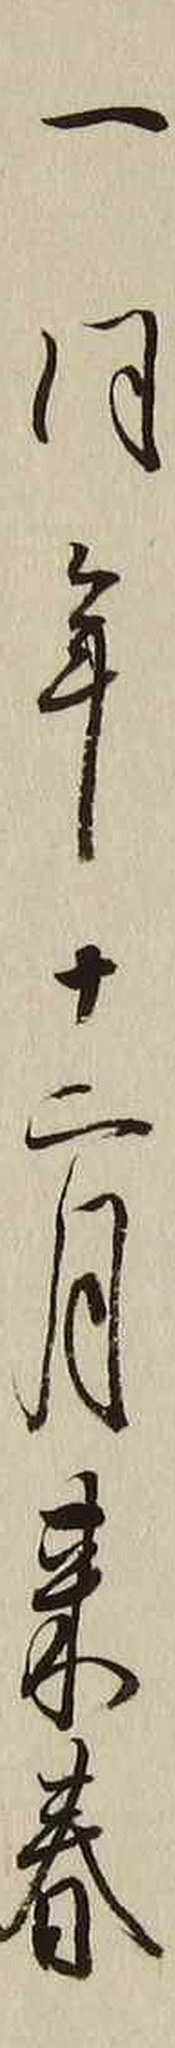一同年十二月来春
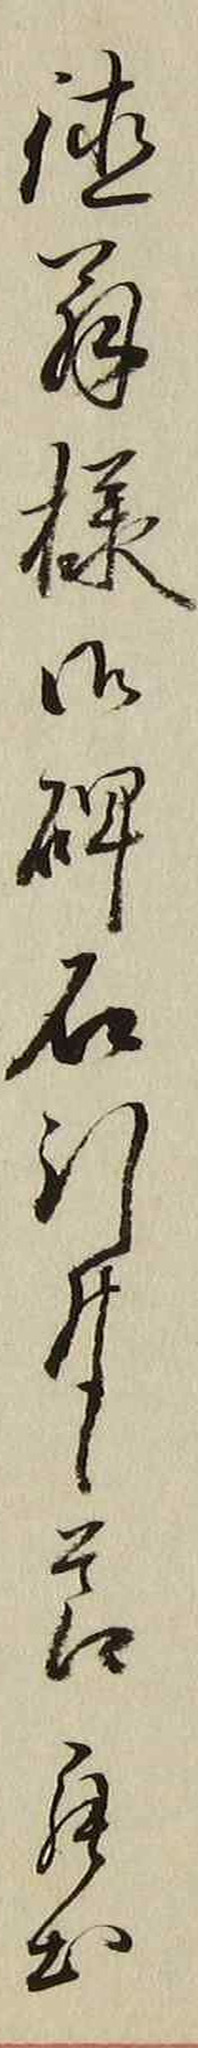徳翁様御碑石引付之節罷出
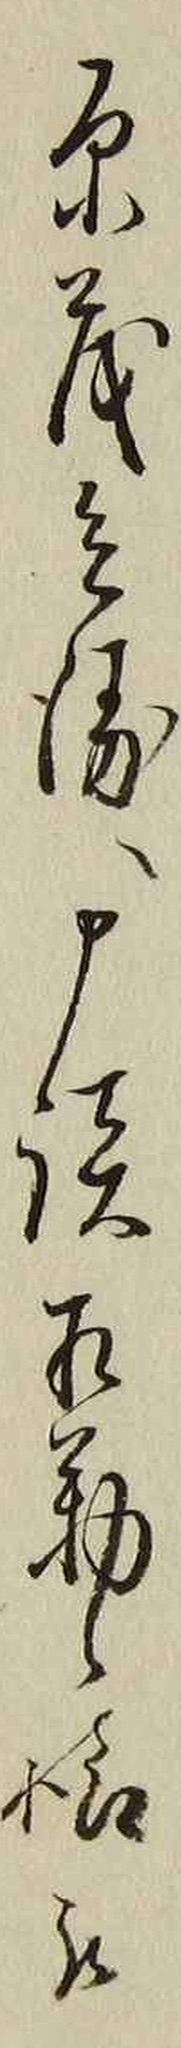原茂兵衛へ申談相勤候様被
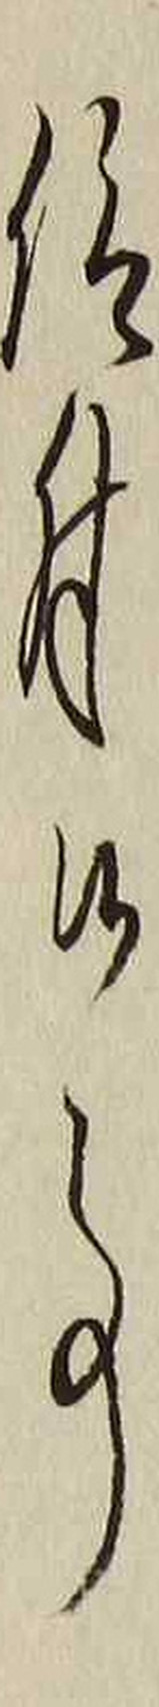仰付候事
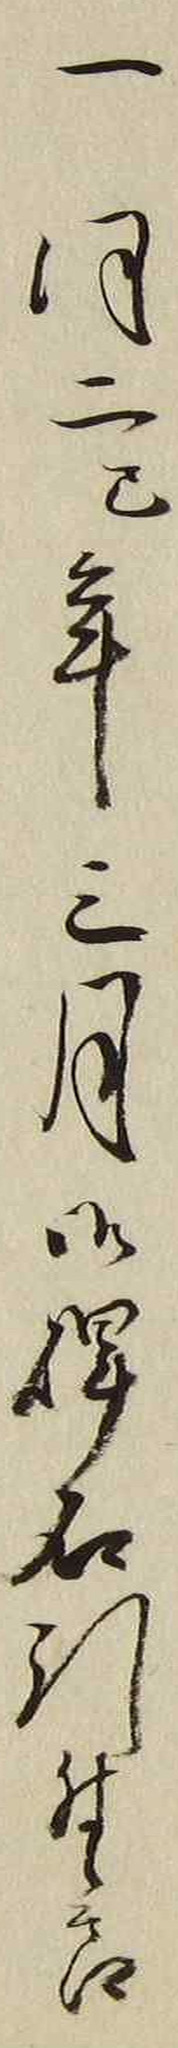一同二巳年三月御碑石引付候節
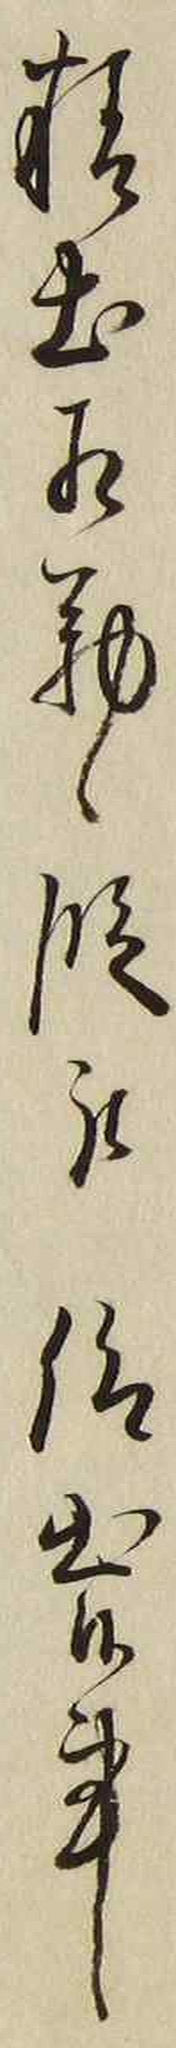精出相勤候段被仰出候事

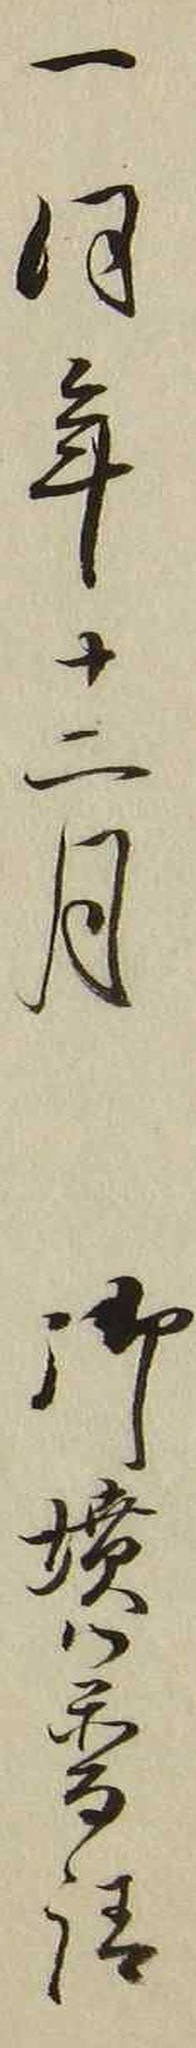一同年十二月御墳御普請
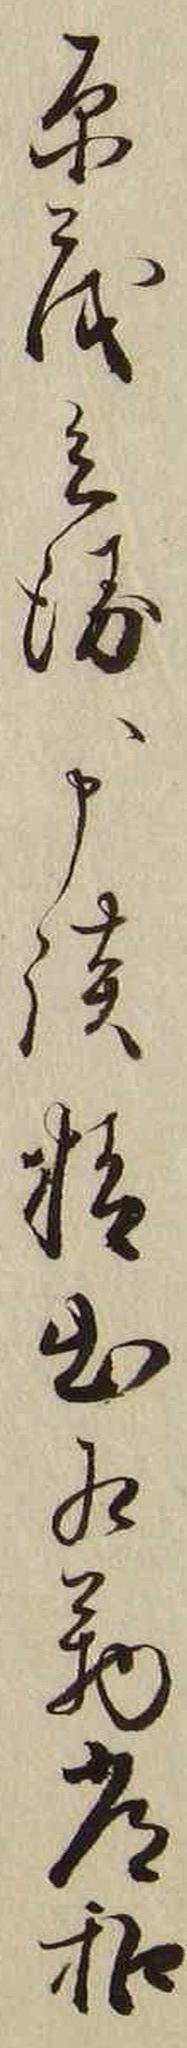原茂兵衛へ申談精出相勤常和
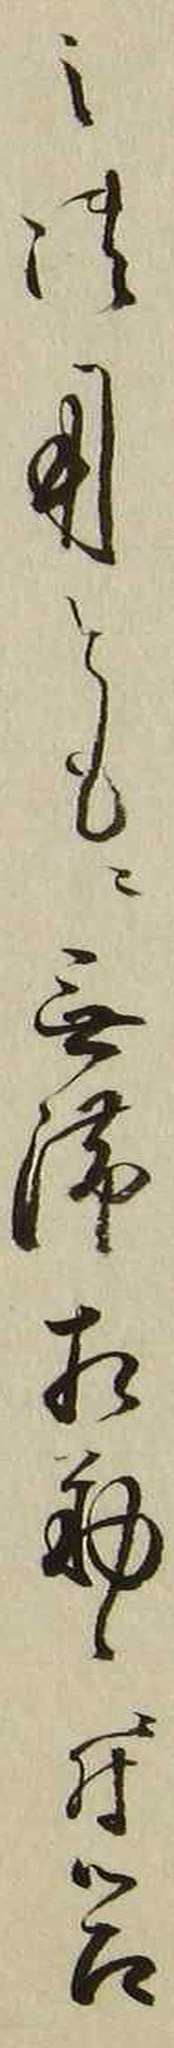之御用ともニ無滞相勅候ニ付御召
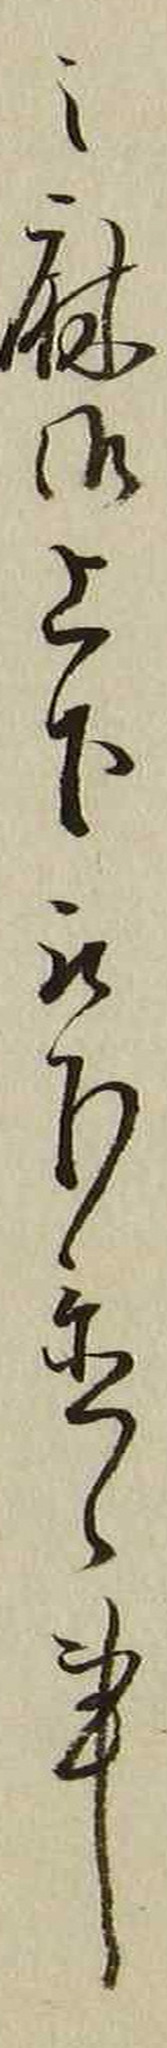之麻御上下被下置候事
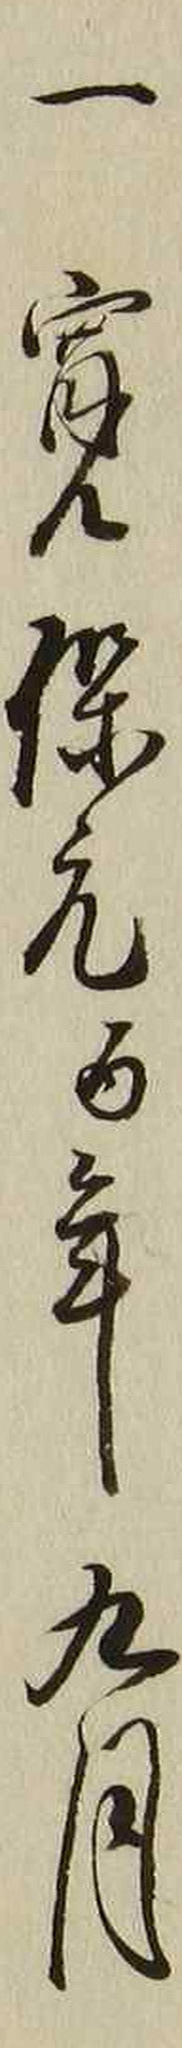一寛保元酉年九月
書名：諸士系譜　巻之1　い之部1
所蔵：会津若松市立会津図書館
